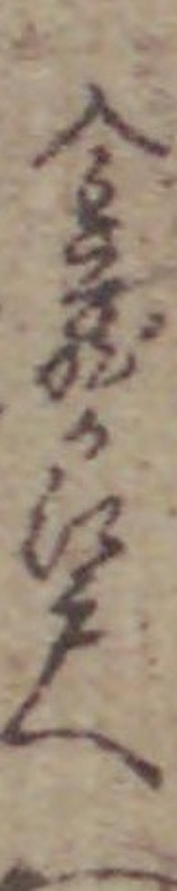金蔵か江戸へ
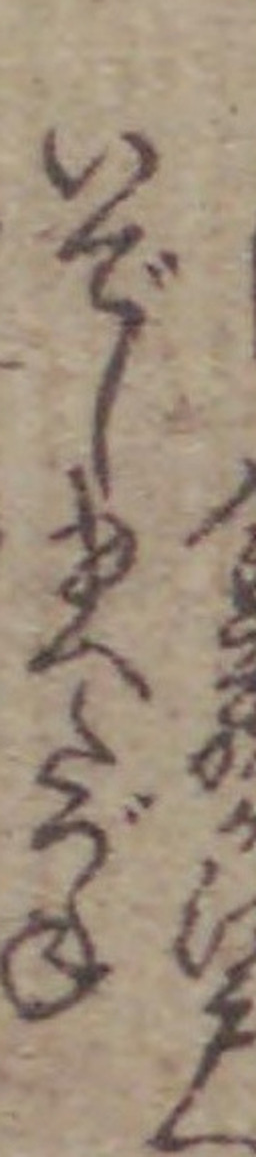いでしゆへたづね
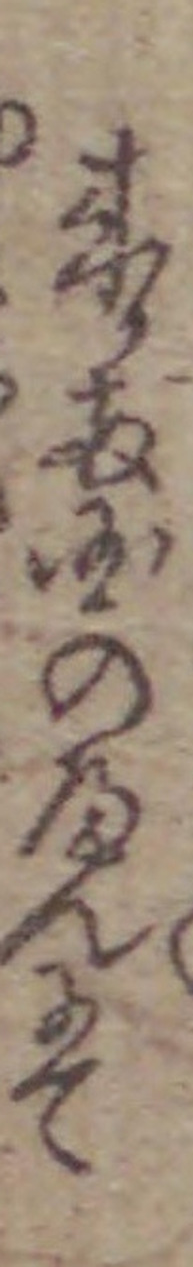来り両国のへんにて
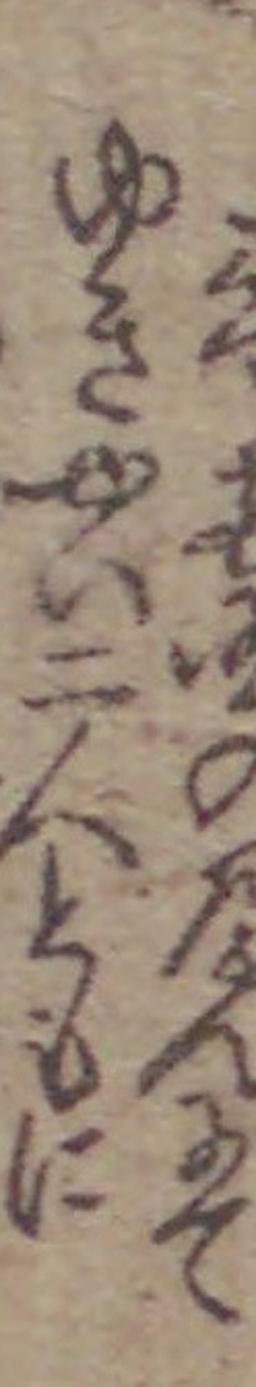ゆきやい二人ともに
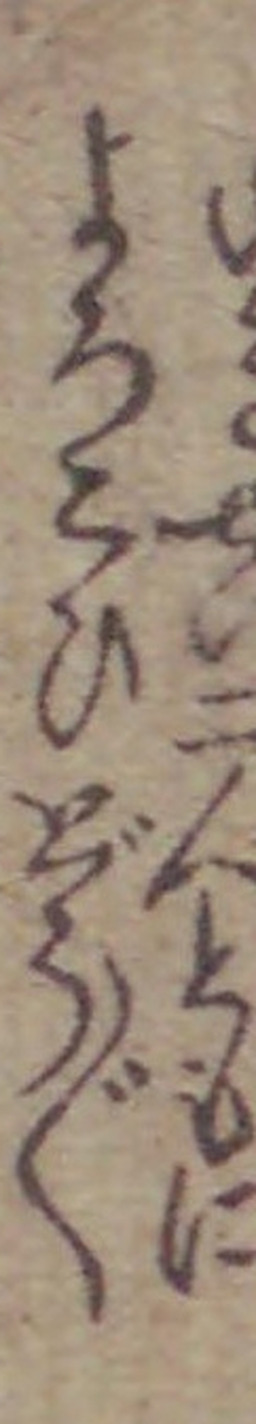よろこひどう〴〵
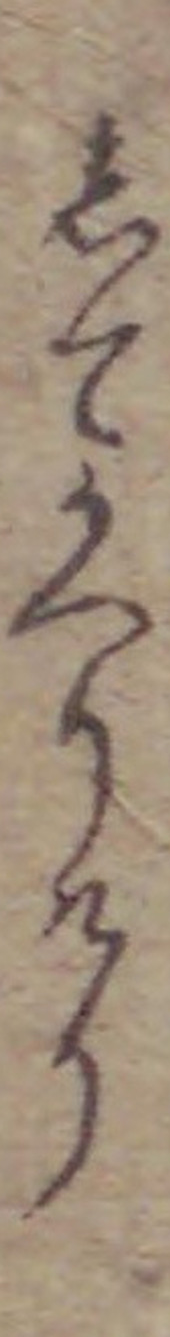してかへりけり

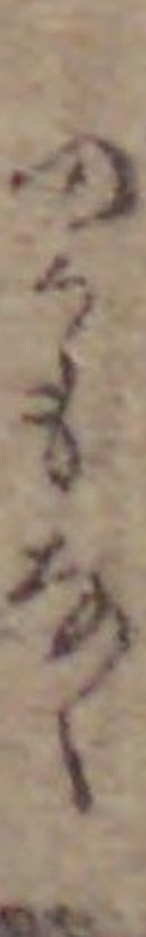つかもなく
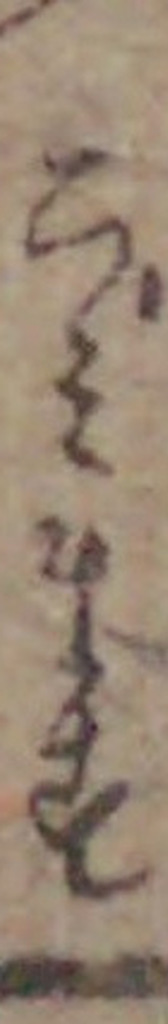こみます
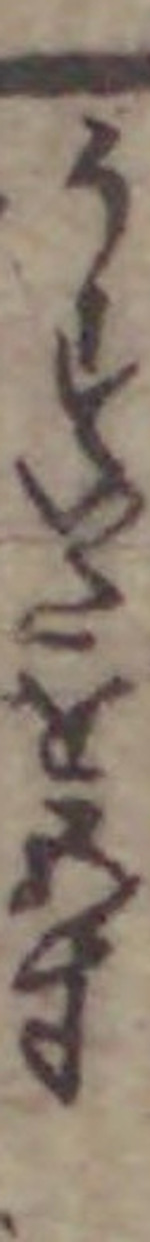うすいたを五寸
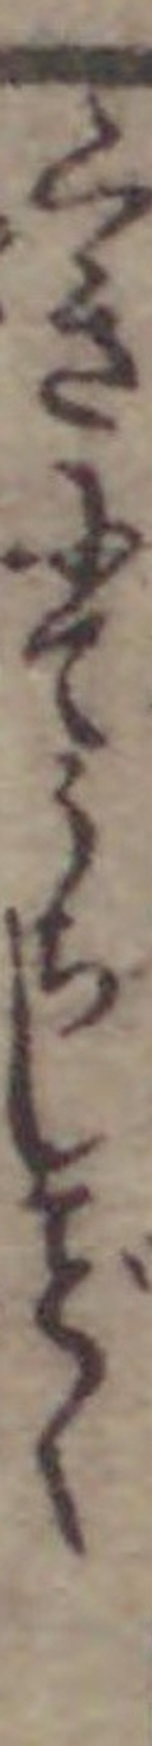くきにてうちしごとく
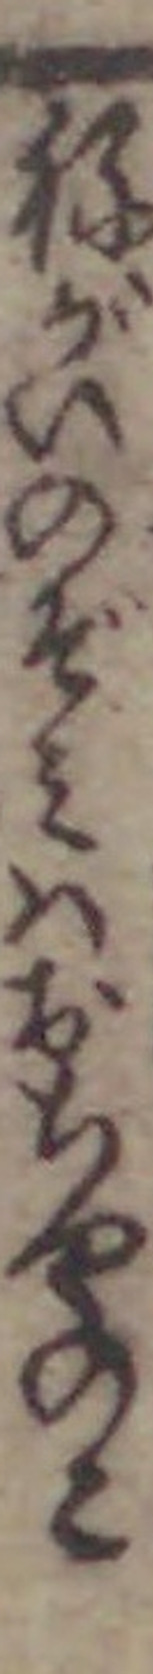ねがいのぞみはおちやのこ
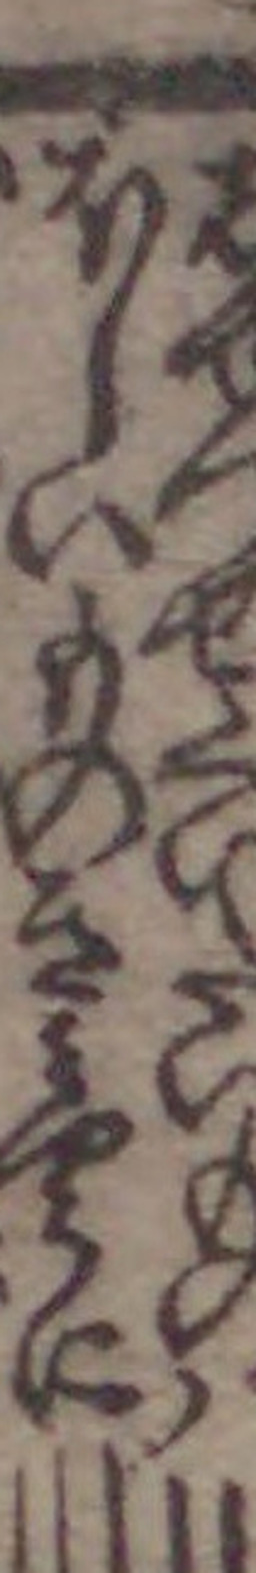ほしいものきみやうに
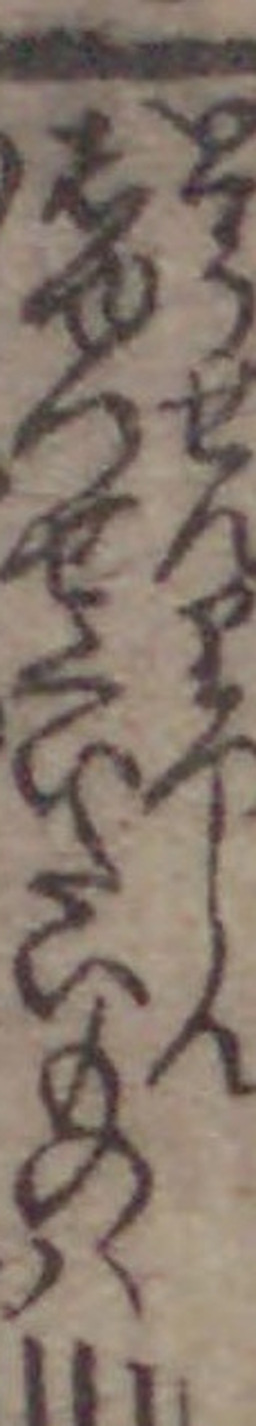しゆつせくいたいものは
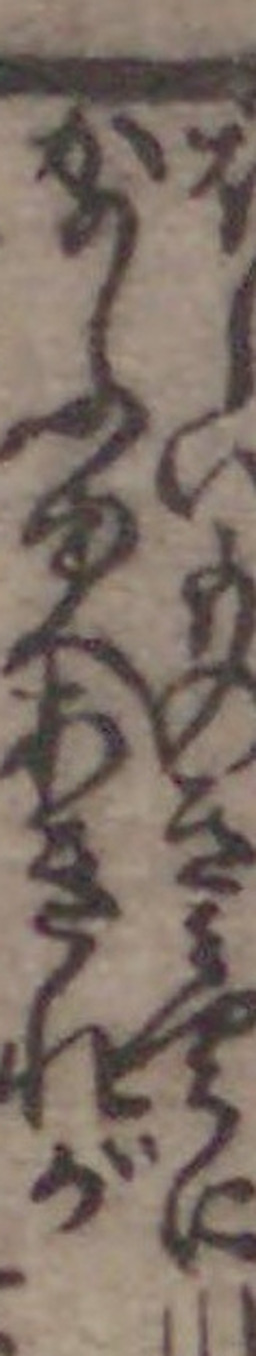かのふゆへあきれが
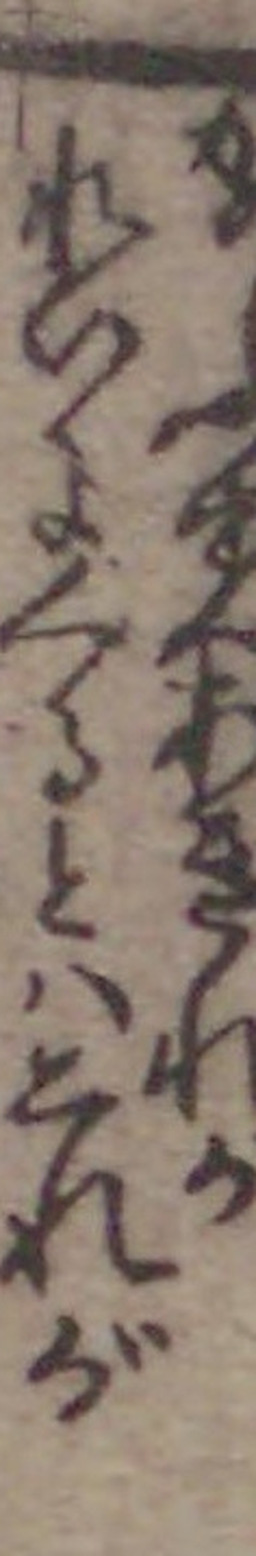れいにくるとはこれが
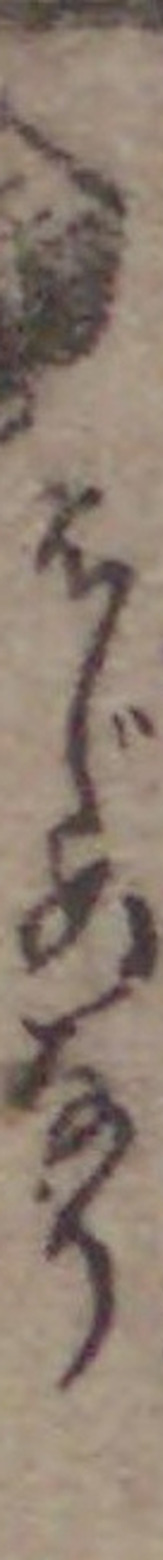はじめなり
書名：御代の御寶
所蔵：国立国会図書館 National Diet Library, JAPAN
